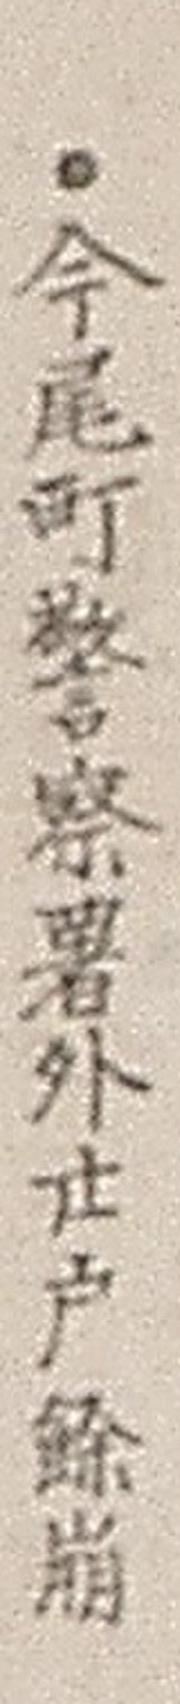●今尾町警察署外廿戸餘崩
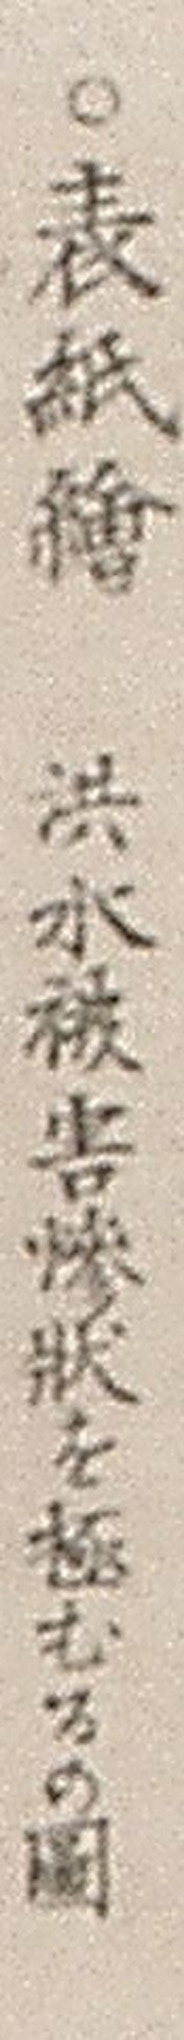◯表紙絵洪水被害惨状を極むるの圖
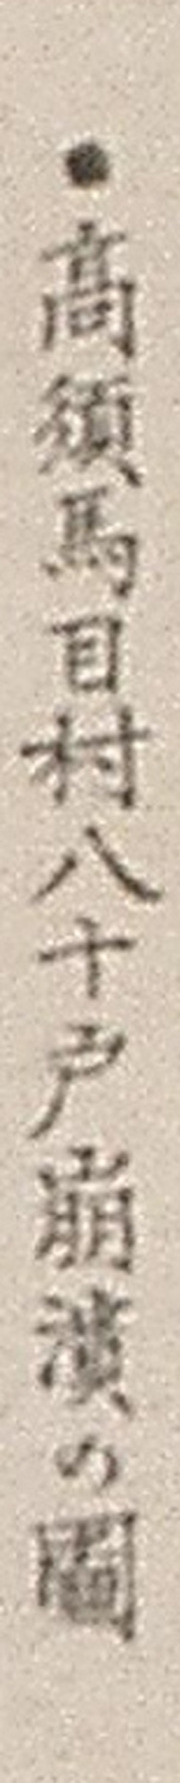●高須馬目村八十戸崩潰の圖
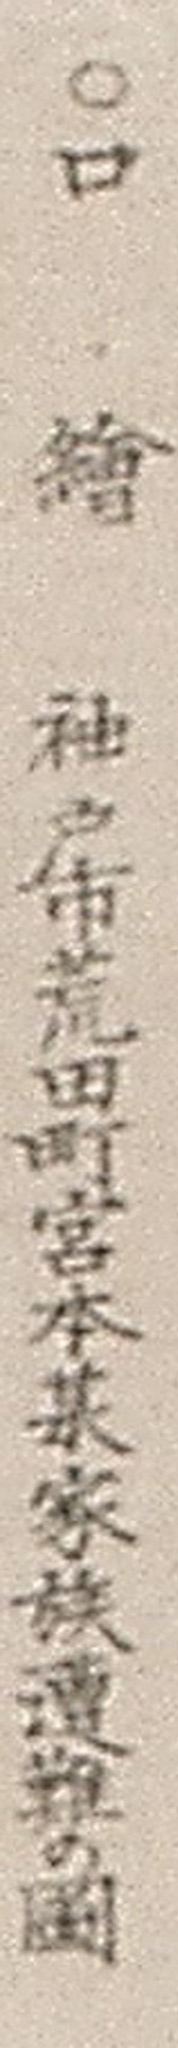◯口絵神戸市荒田町宮本某家族遭難の圖
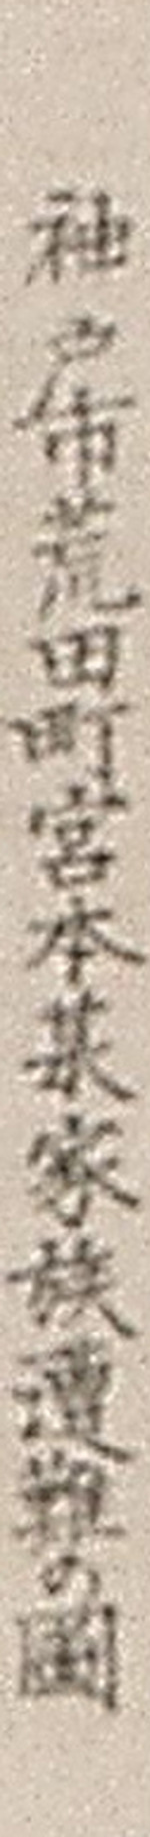◯口絵神戸市荒田町宮本某家族遭難の圖
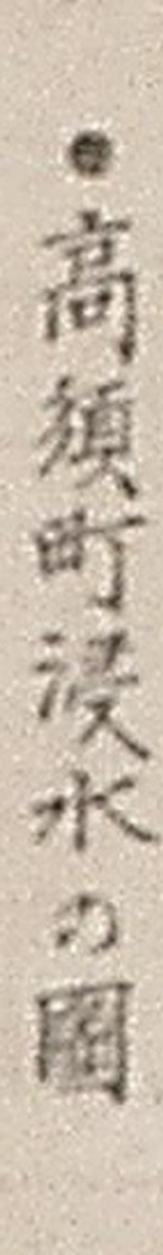●高須町浸水の圖
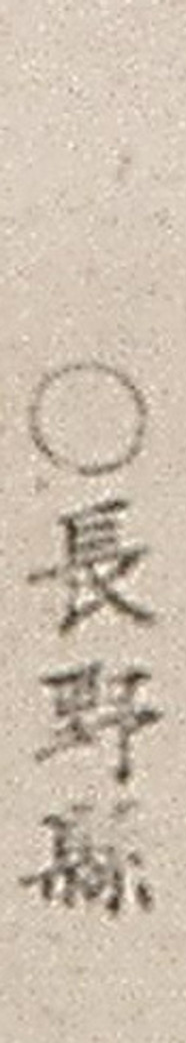◯長野県
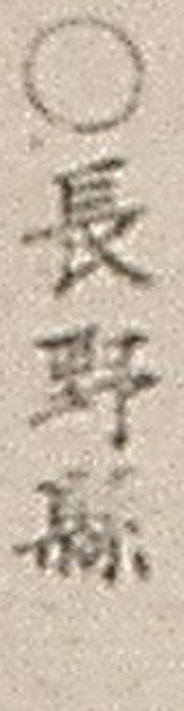◯長野県
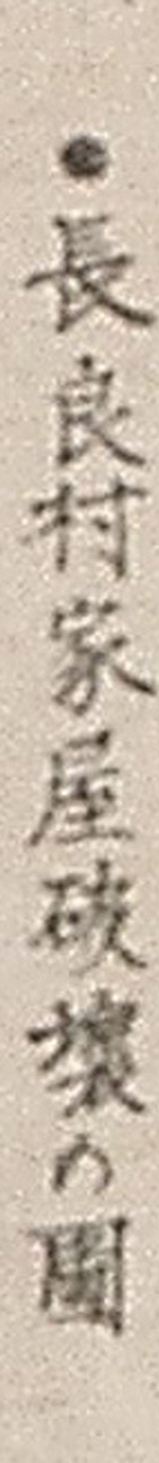●長良村家屋破壊の圖
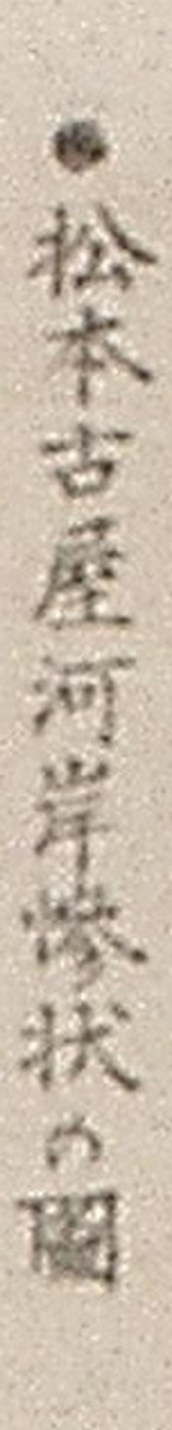●松本古屋河岸惨状の圖
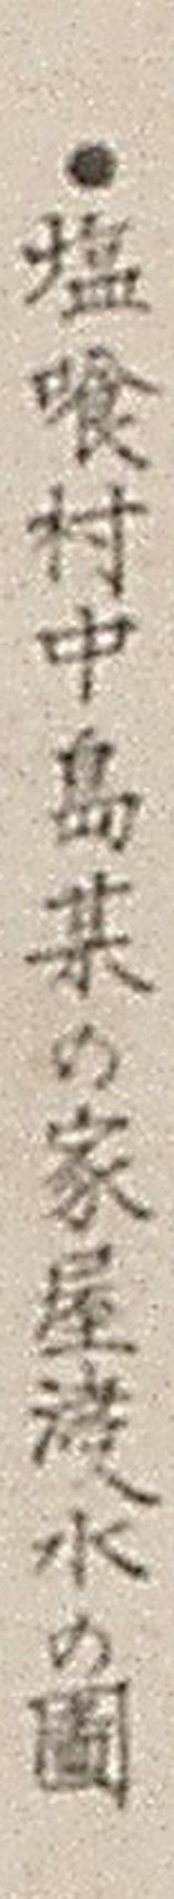●塩喰村中島某の家屋浸水の圖
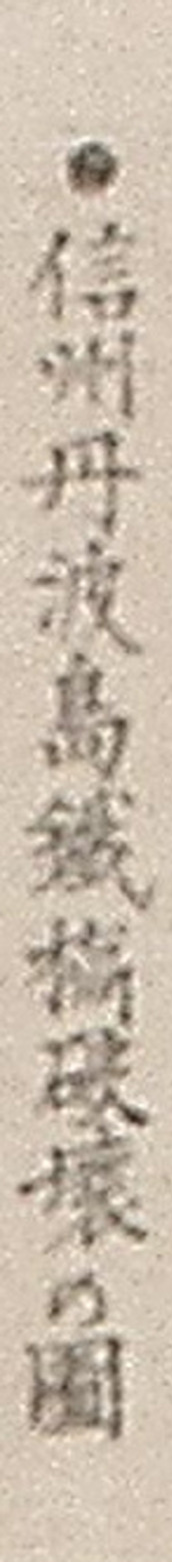●信州丹波島鉄橋破壊の圖
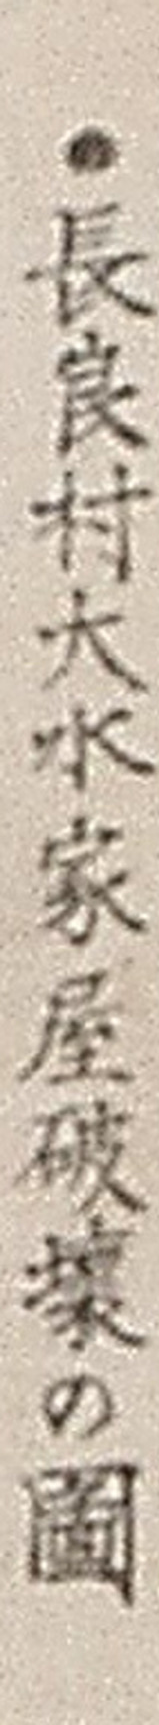●長良村大水家屋破壊の圖
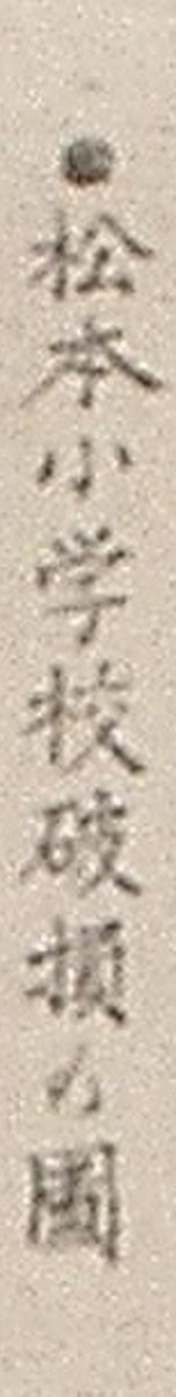●松本小学校破損の圖
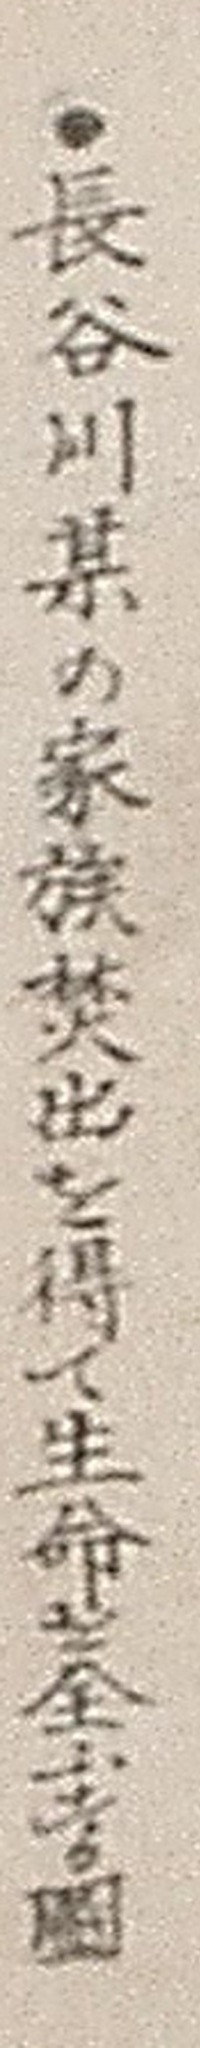●長谷川某の家族炊出を得て生命を全ふする圖
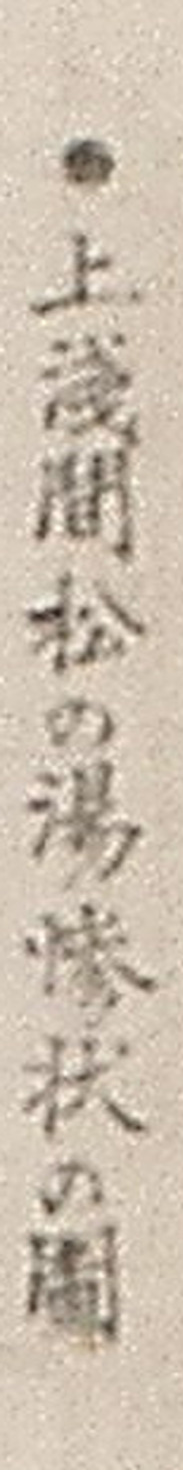●上浅間松の湯惨状の圖
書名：風俗畫報臨時増刊第百二十六號　洪水被害録（中）
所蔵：東京大学地震研究所図書室 Earthquake Research Institute Library, The University of Tokyo, JAPAN
